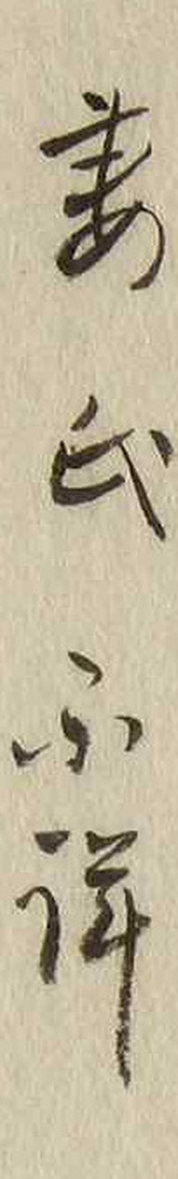母氏不詳
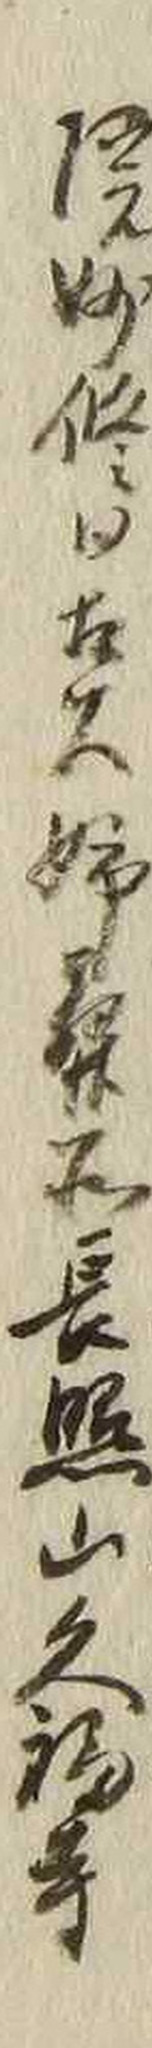院妙修日相大姉葬所長照山久福寺
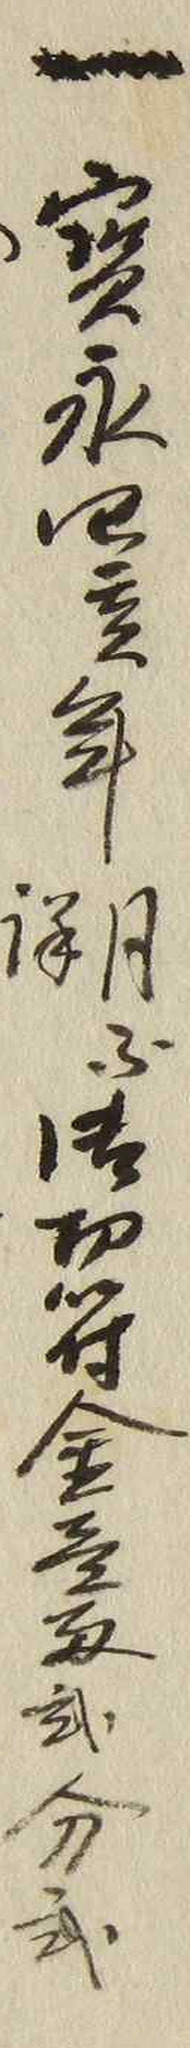一宝永四亥年月不詳御切符金壱両弐分弐
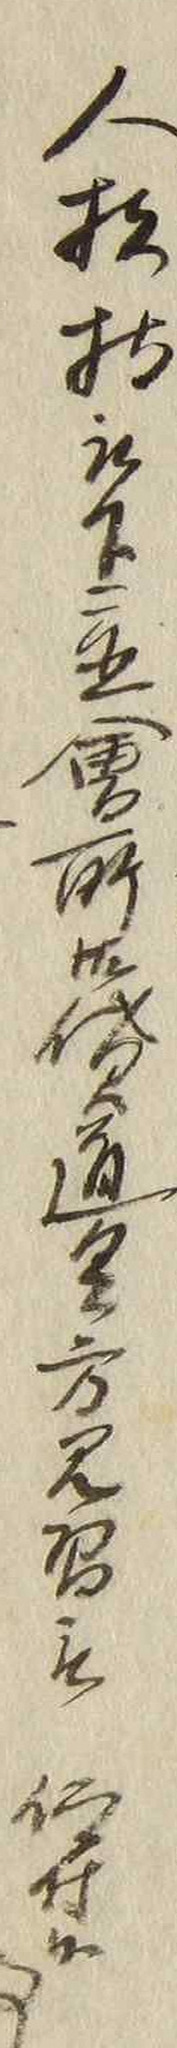人扶持被下置会所御貸道具方見習被仰付候事
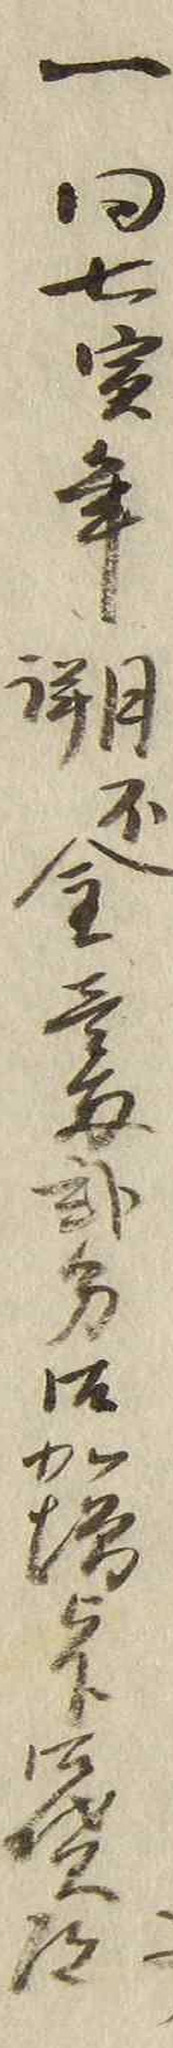一同七寅年月不詳金壱両弐分御加増被下御貸道

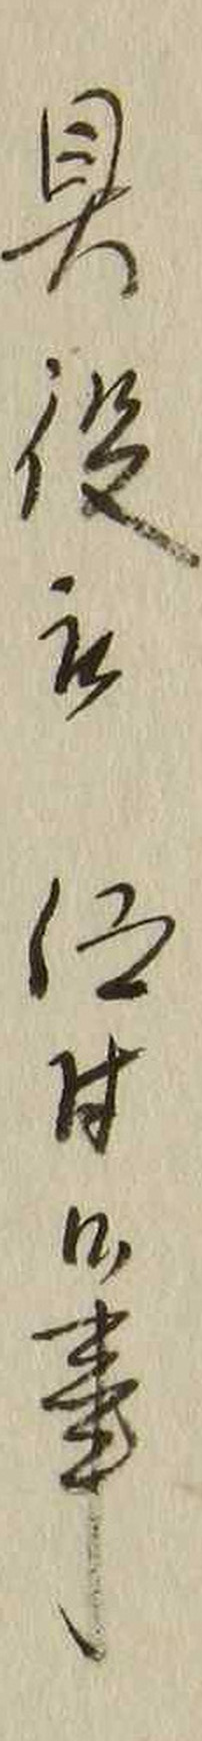具役被仰付候事
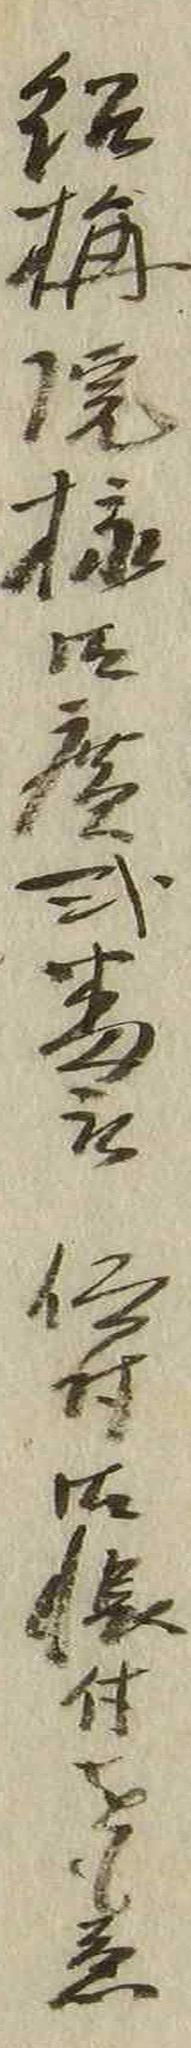紹栴院様御広式番被仰付御帳付をも兼
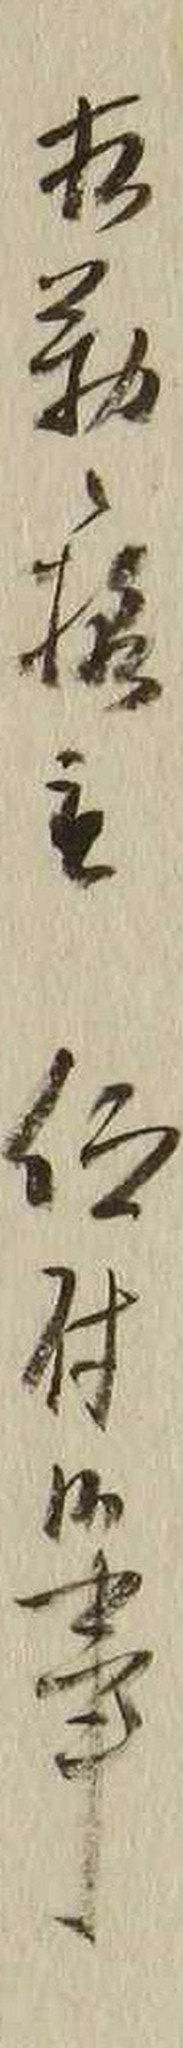相勤候様被仰付候事
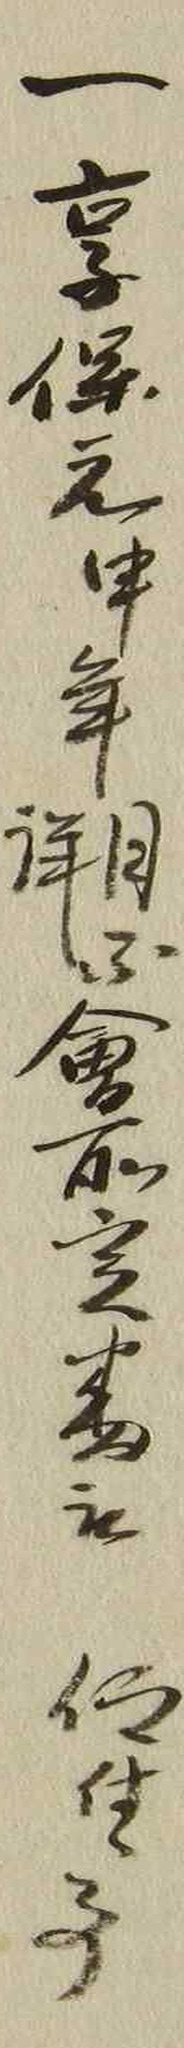一享保元申年月不詳会所定番被仰付候事
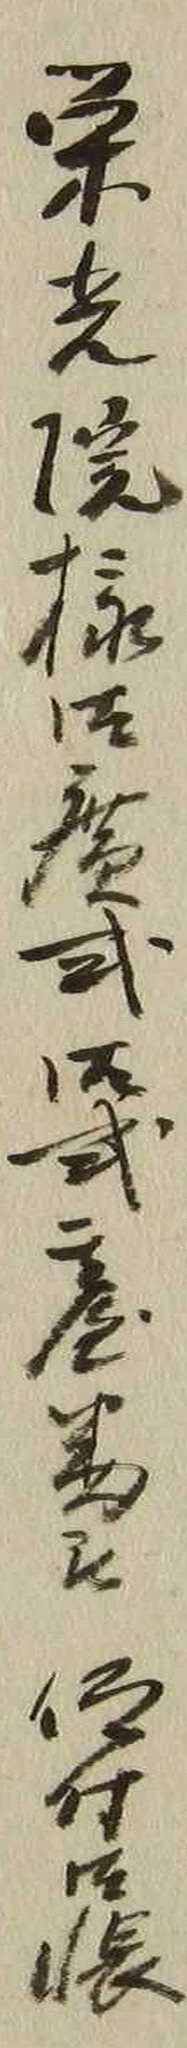栄光院様御広式御式台番被仰付御帳
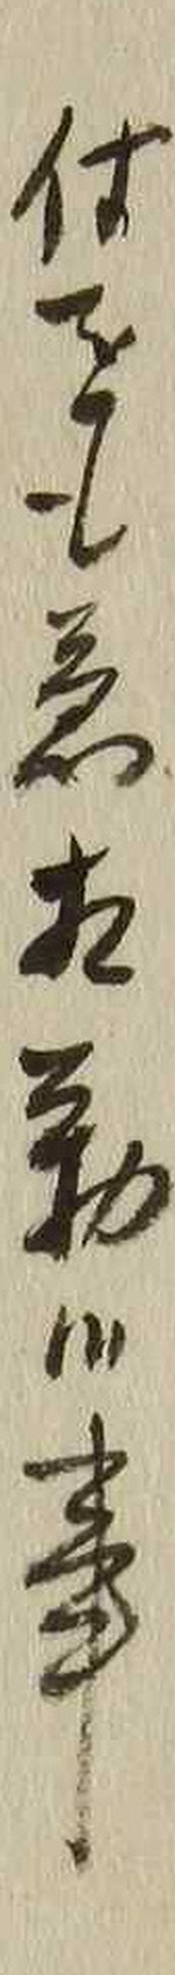付をも兼相勤候事
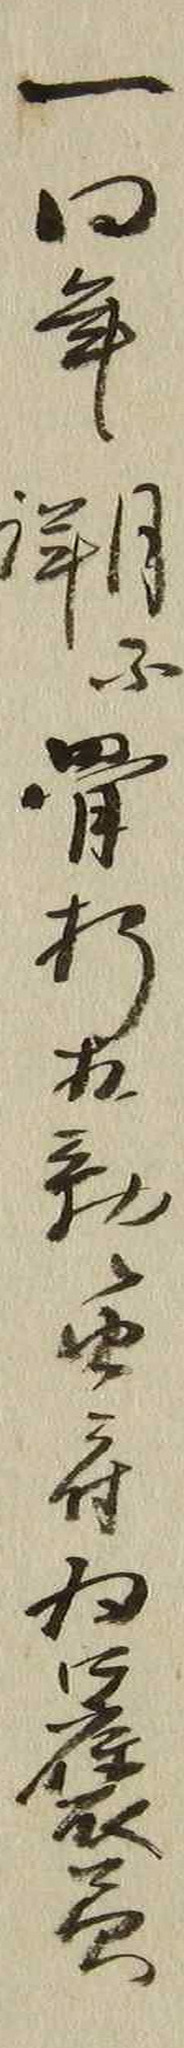一同年月不詳骨折相勤候由ニ付為御褒美
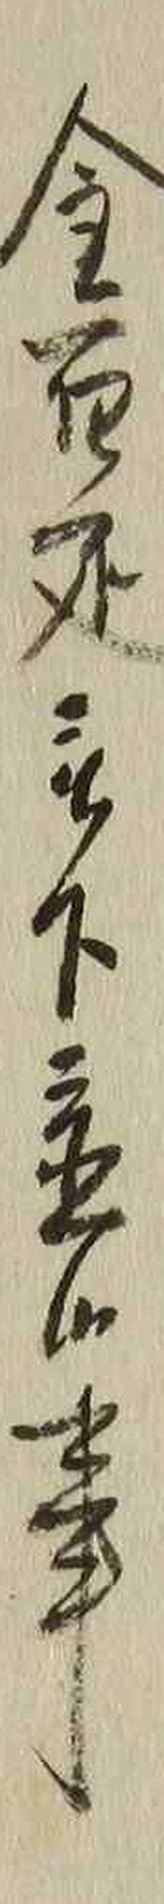金百疋被下置候事
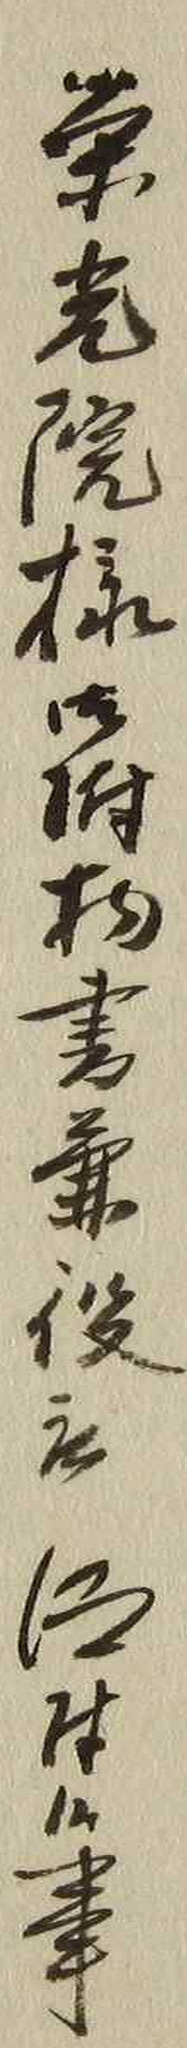栄光院様御附物書兼役被仰付候事
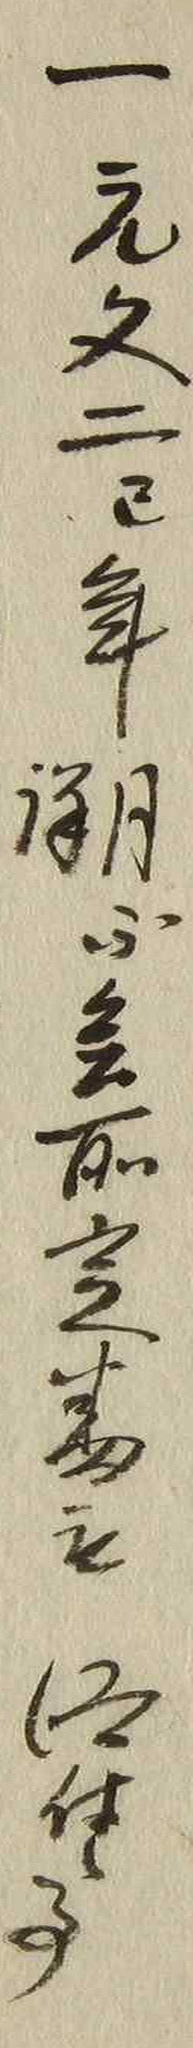一元文二巳年月不詳会所定番被仰付候事
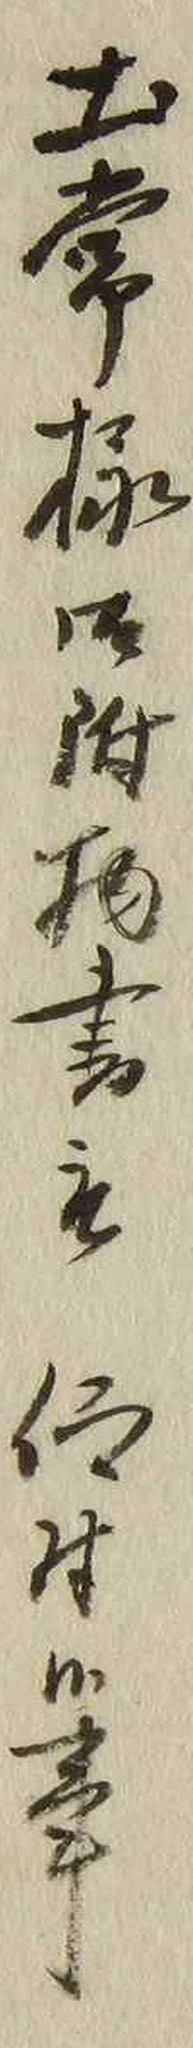土常様御附物書被仰付候事
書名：諸士系譜　巻之360　す之部10
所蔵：会津若松市立会津図書館
